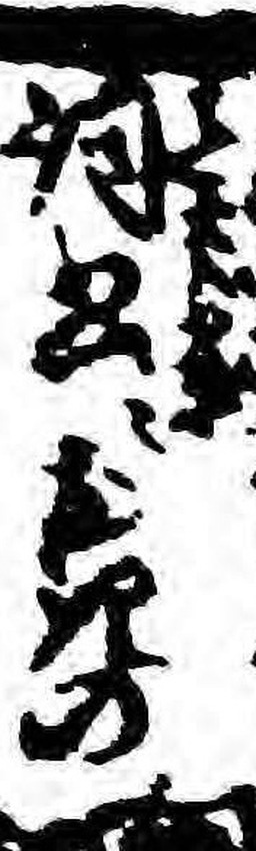詞書におきの
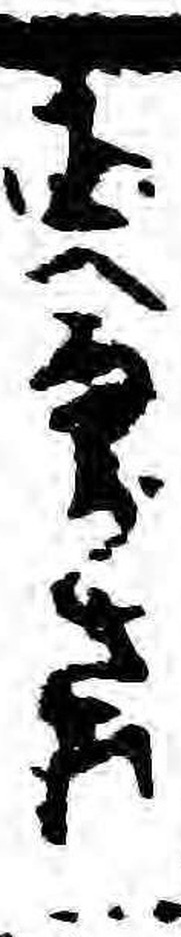国へながされ
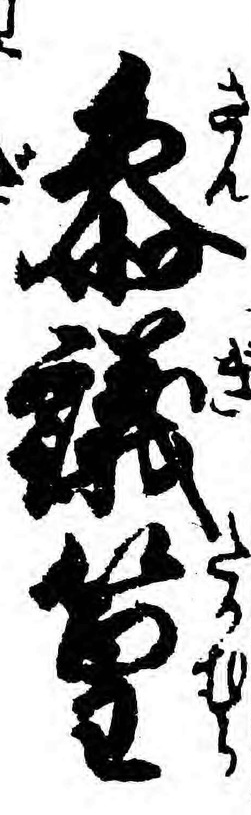参議篁
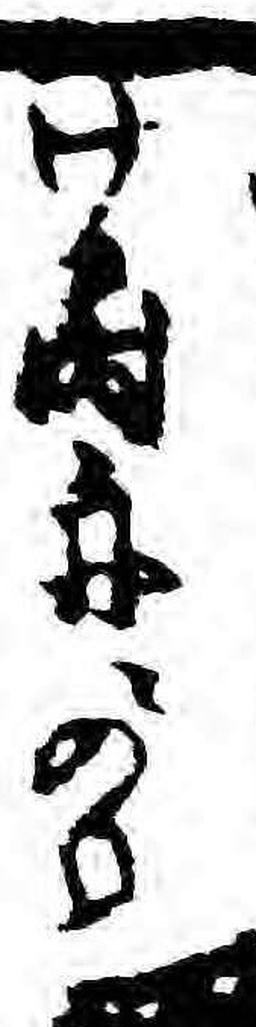ける時舟にのり
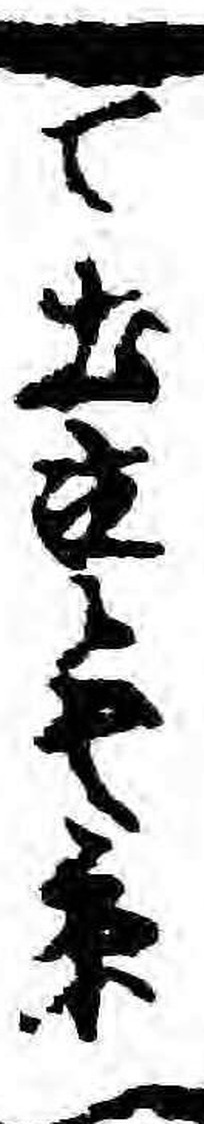て出立とて京
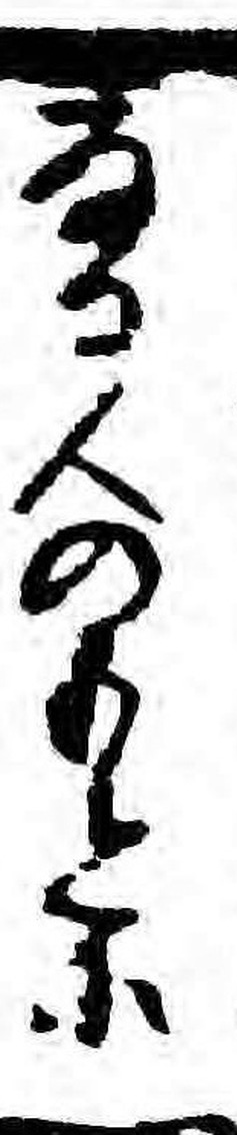なるひとのもとに
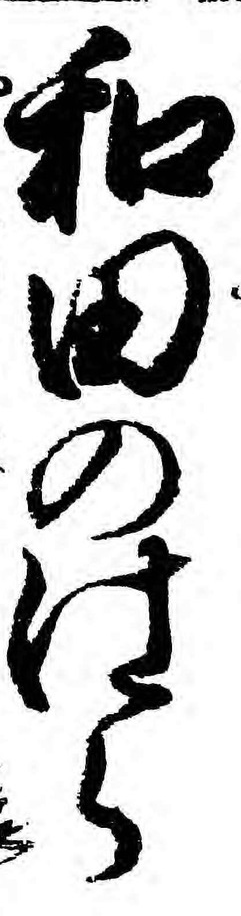和田のはら
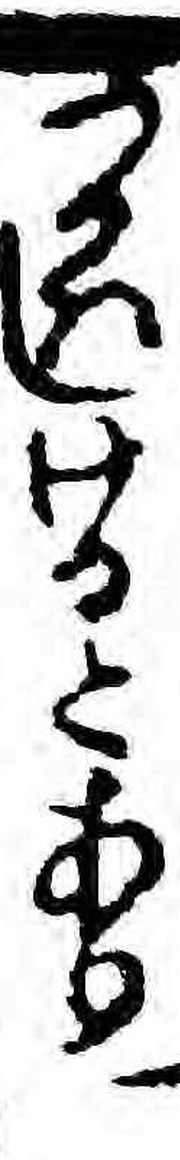つかはしけるとあり
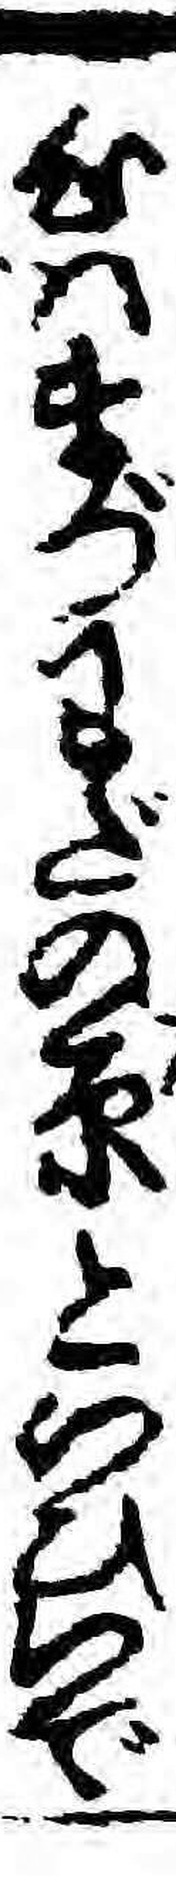心はまづわだの原といひいで
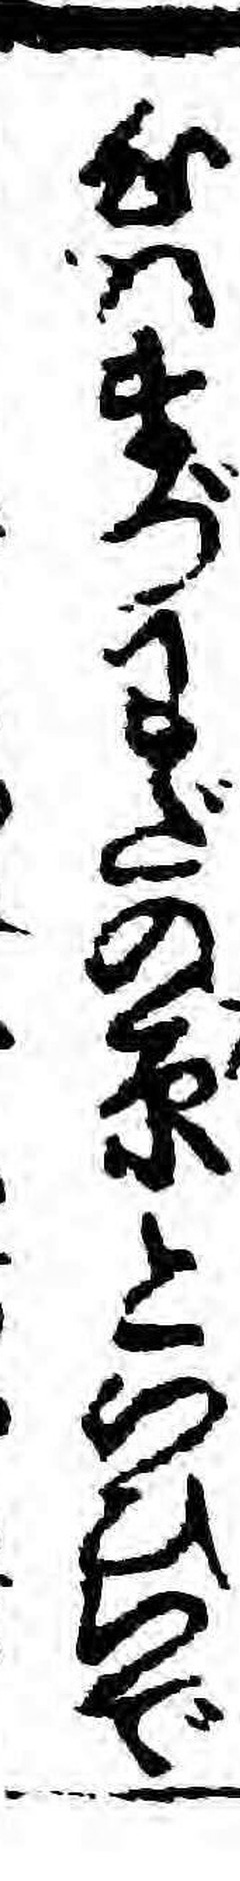心はまづわだの原といひいで
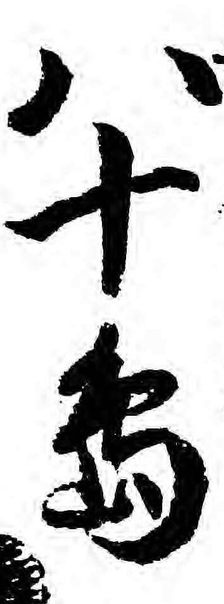八十島
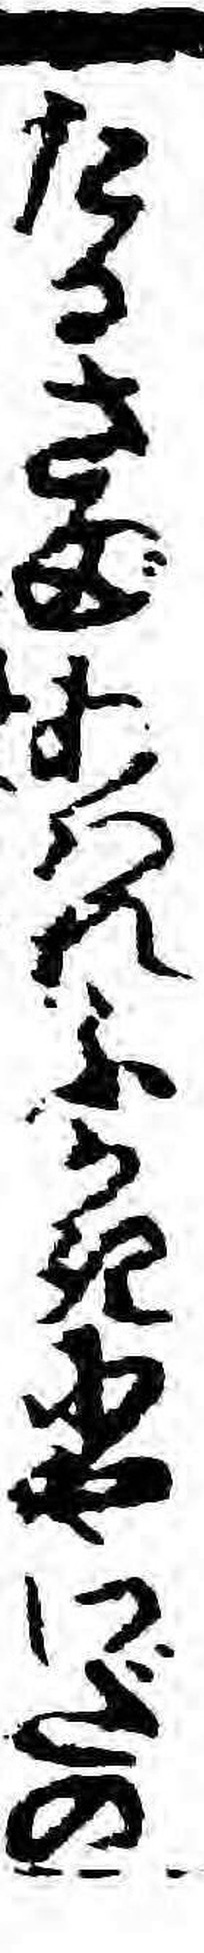たるさまあはれふかきにやわだの
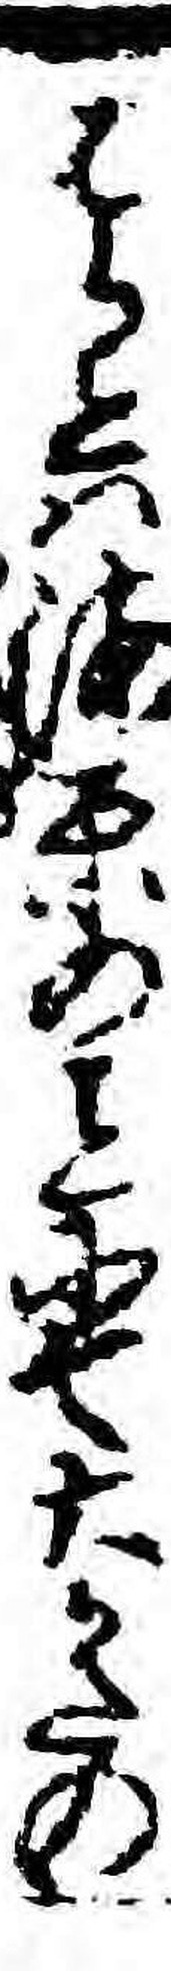はらとは海原のことにて大かたの
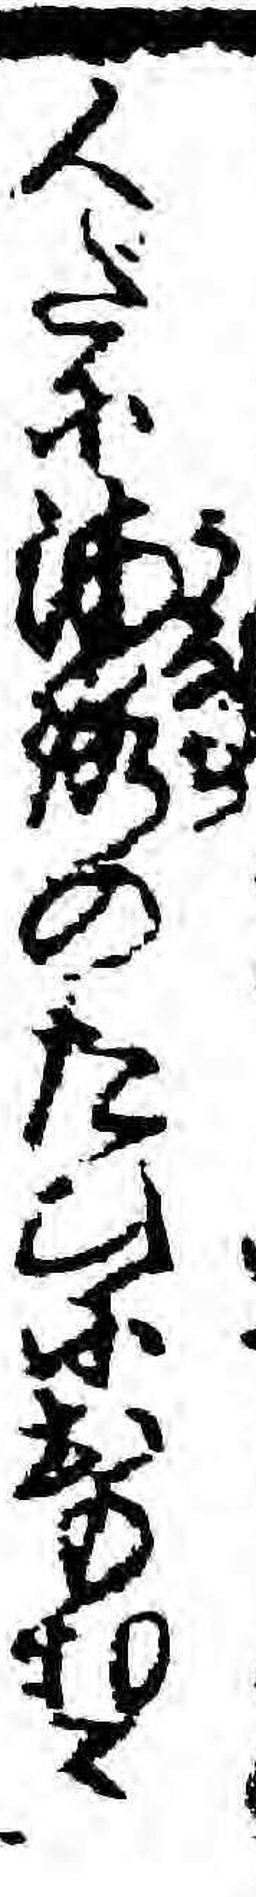人だに海路のたひにおもむく
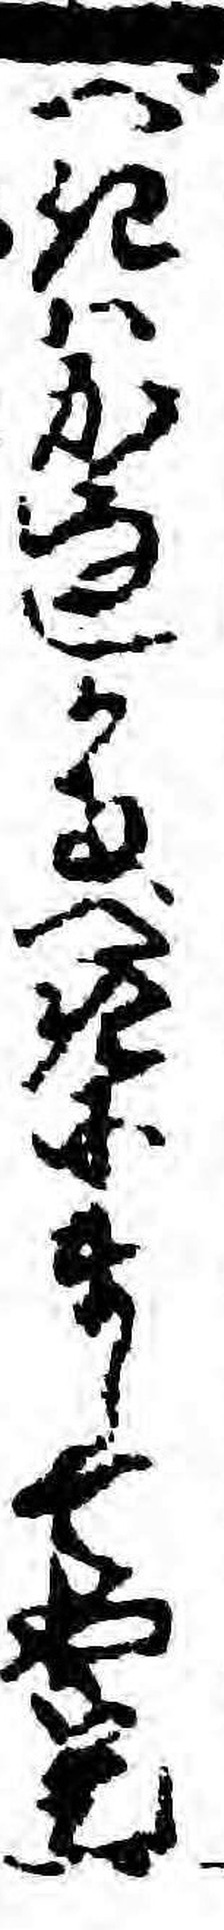べきはかなしかるべきにましてや是
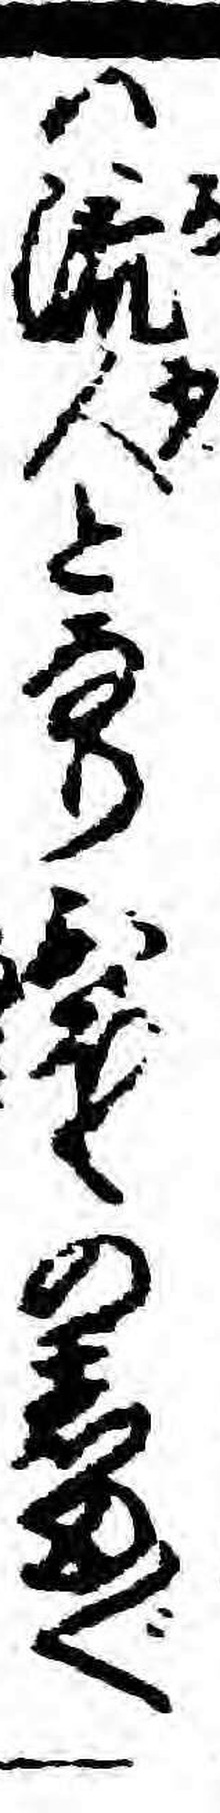は流人となりおほくのしま〴〵
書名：頭書和歌注譯／壽賀多百人一首小倉錦
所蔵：国文学研究資料館
